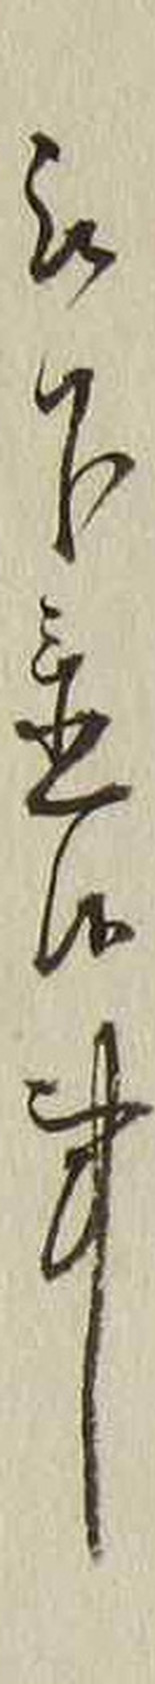被下置候事
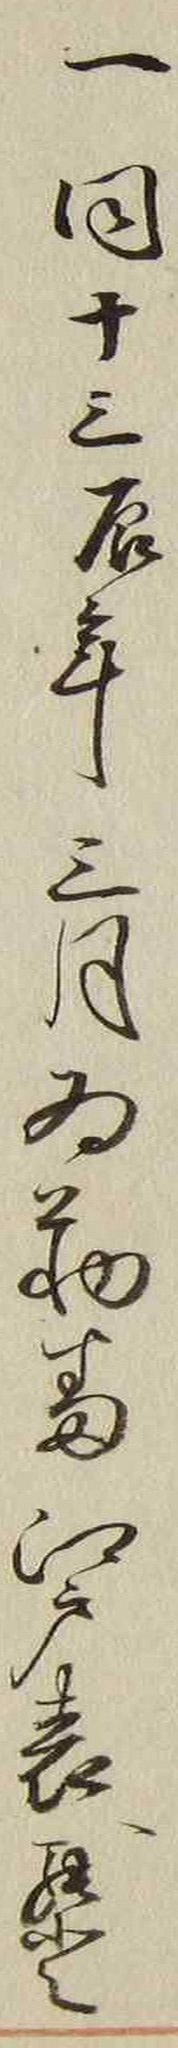一同十三辰年三月為勤番江戸表へ罷登
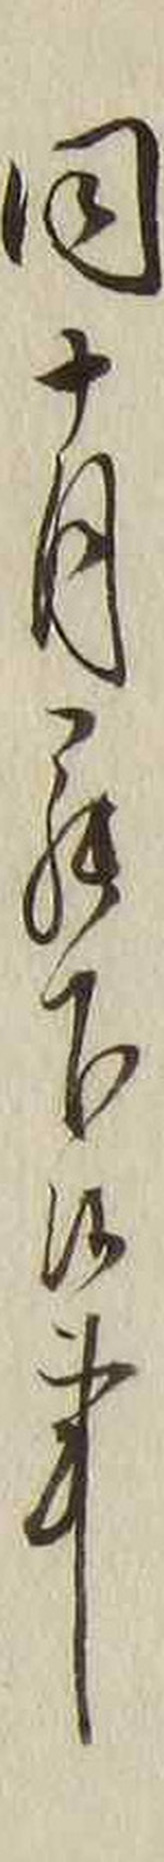同十月罷下候事

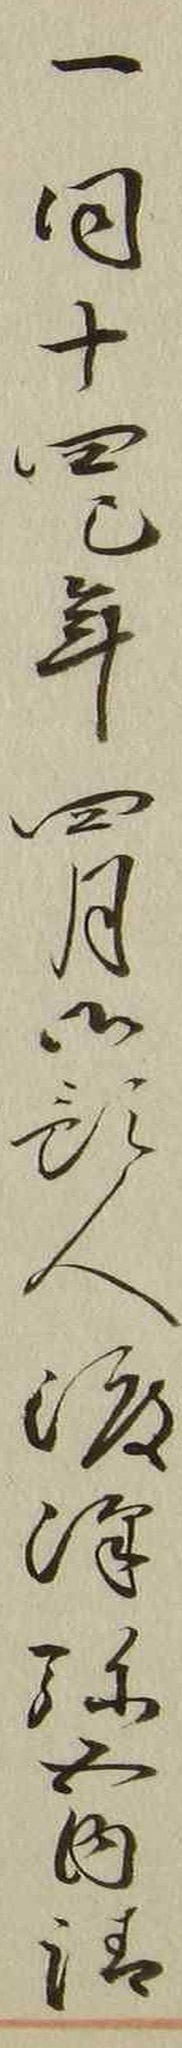一同十四巳年四月御預人渡沢弥五内請
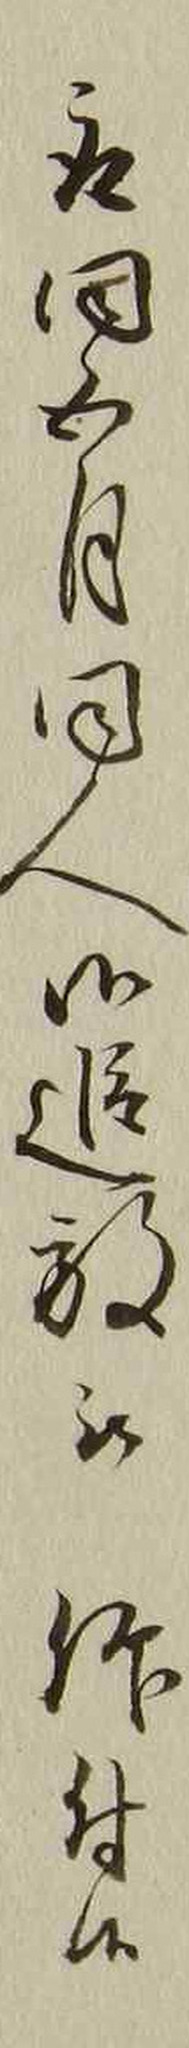取同五月同人御追放被仰付候
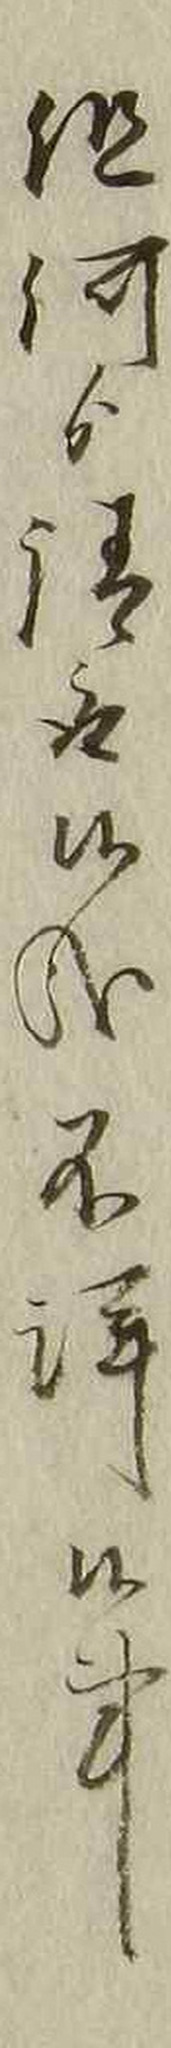但何ゟ請取候哉不拝候事
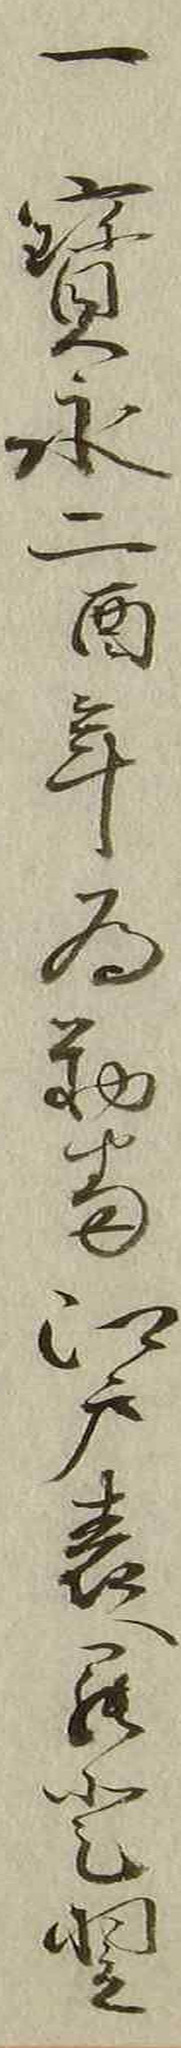一宝永二酉年為勤番江戸表へ罷登翌
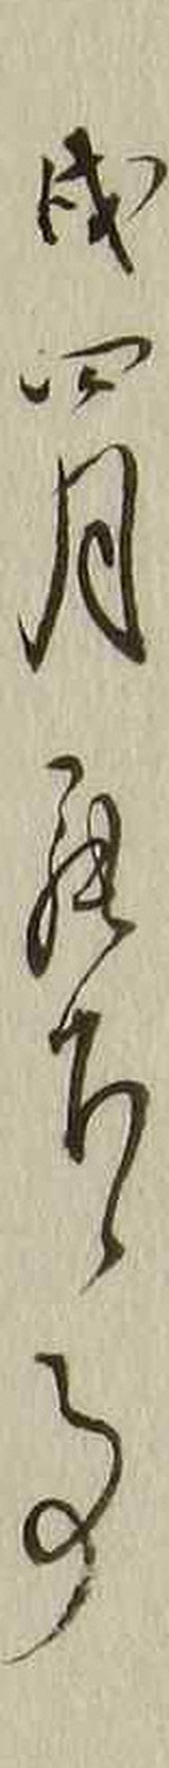戌四月罷下候事
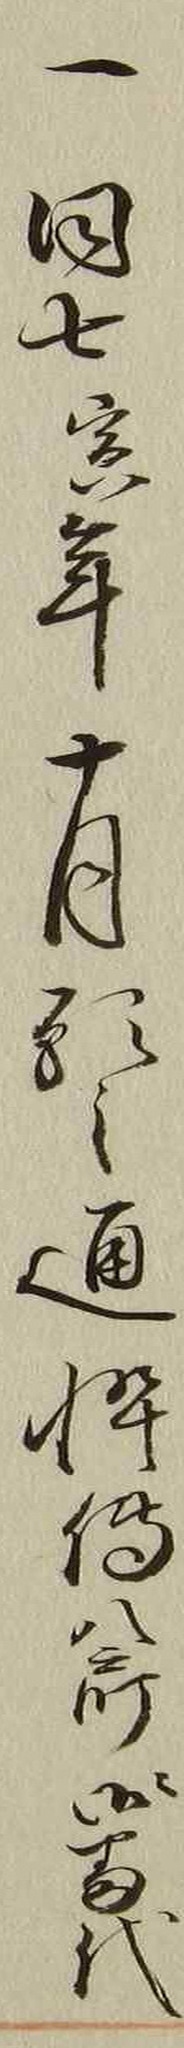一同七寅年十月願之通忰伝八郎ニ御番代
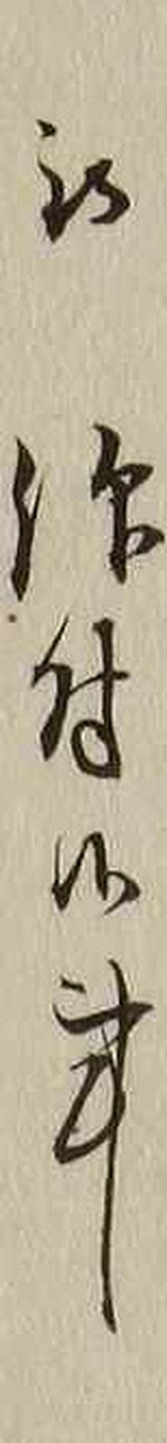被仰付候事
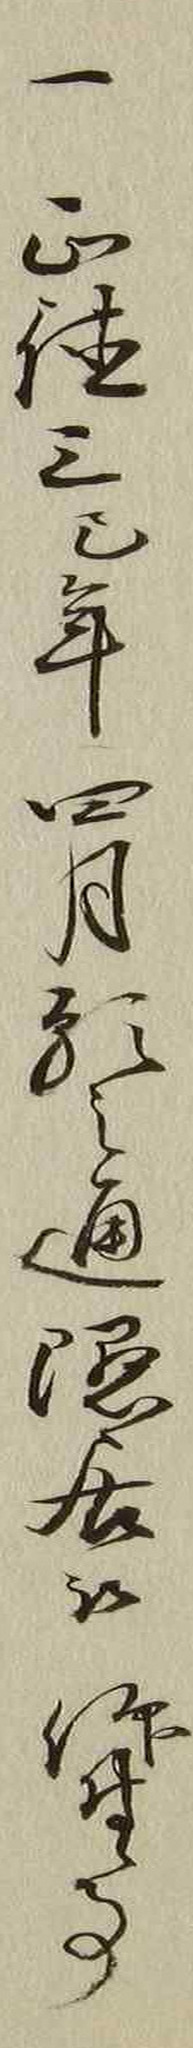一正徳三巳年四月願之通隠居被仰付候事
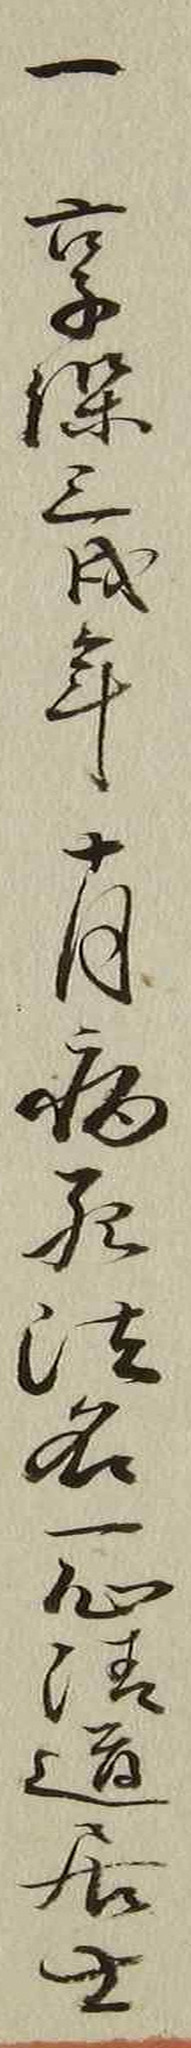一享保三戌年十月病死法名一心清道居士
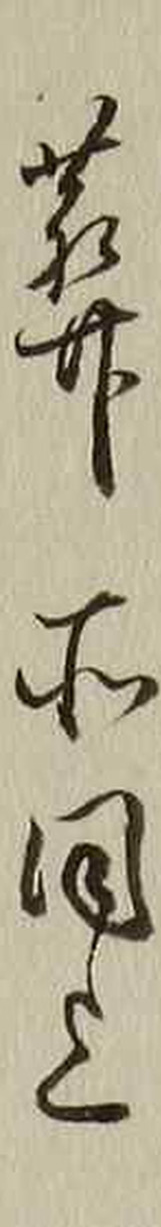葬所同上
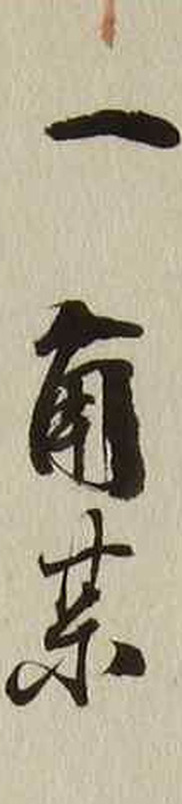一角某
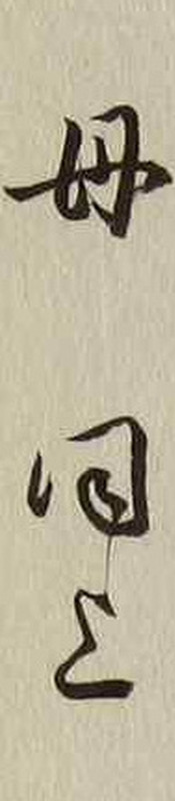母同上
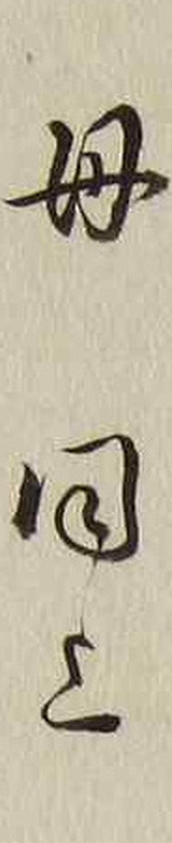母同上
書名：諸士系譜　巻之122　よ之部5
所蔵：会津若松市立会津図書館
